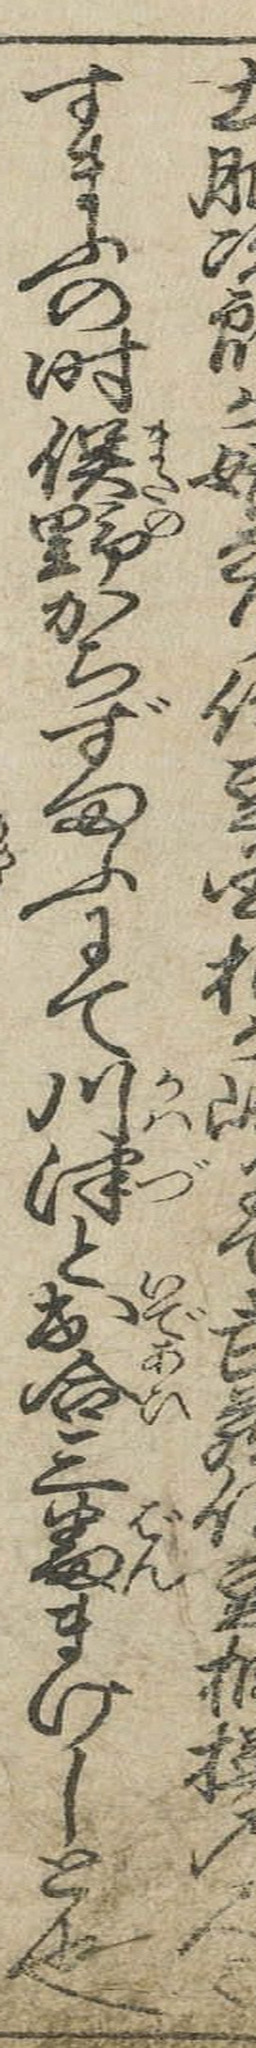すまふの時俣野かちずまふにて川津と出合三番まけしと也
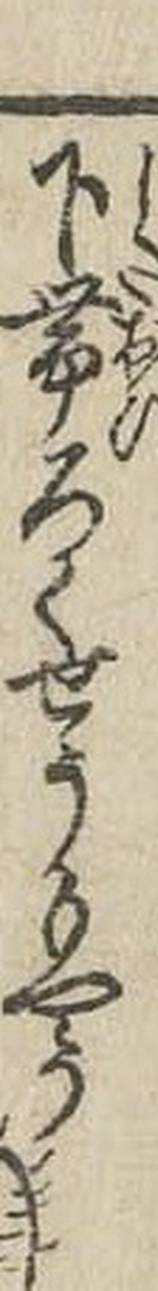下帯ろくせうもやう
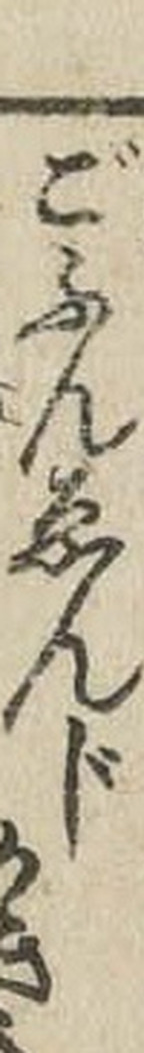ごふんゑんじかき入
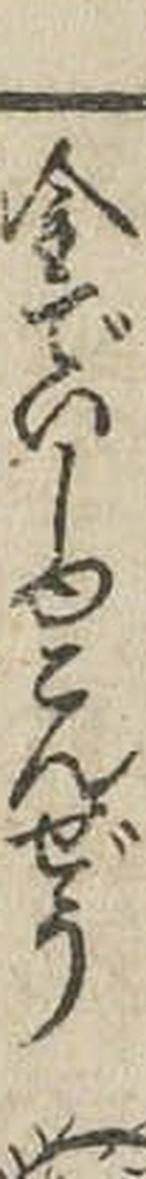金でいしゆこんぜう
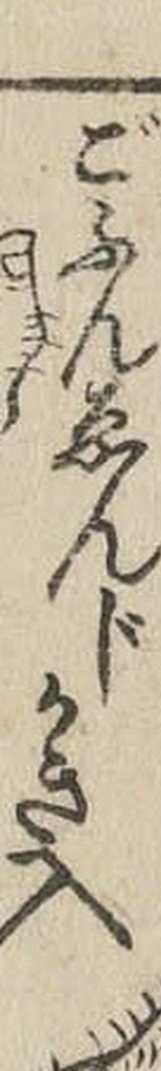ごふんゑんじかき入
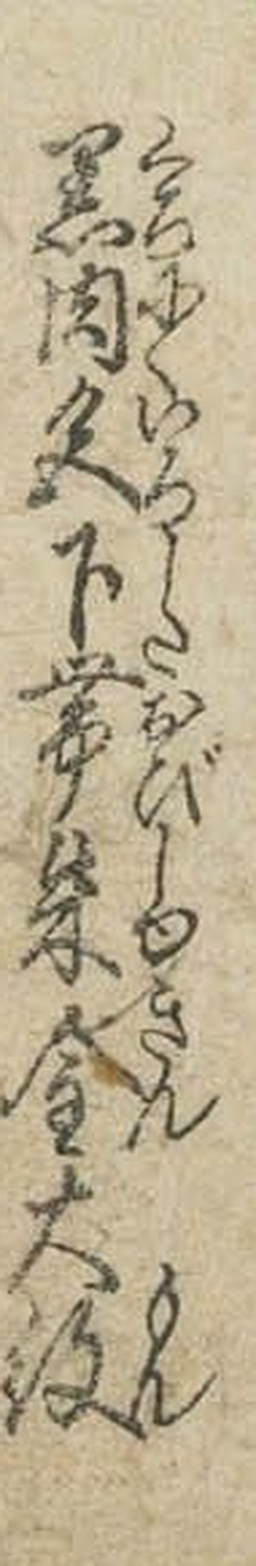黒肉色下帯朱金大紋
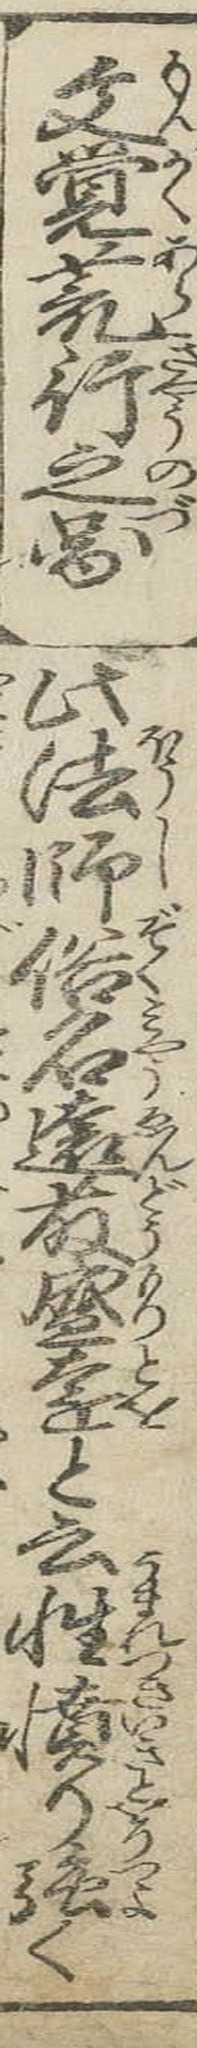文覚荒行之図此法師俗名遠藤盛遠と云性憤り強く
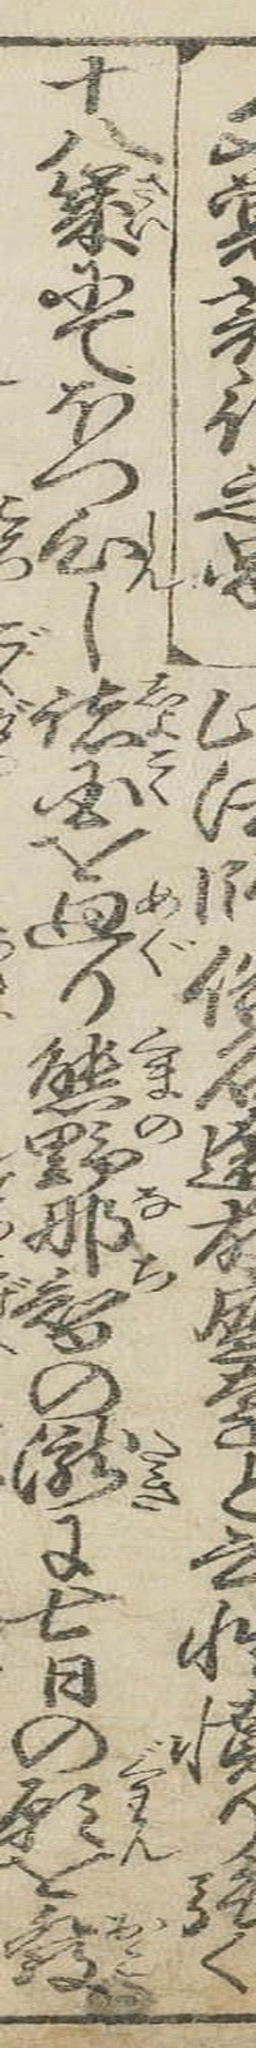十八歳にてほつ心し諸国を廻り熊野那智の滝に七日の願を発
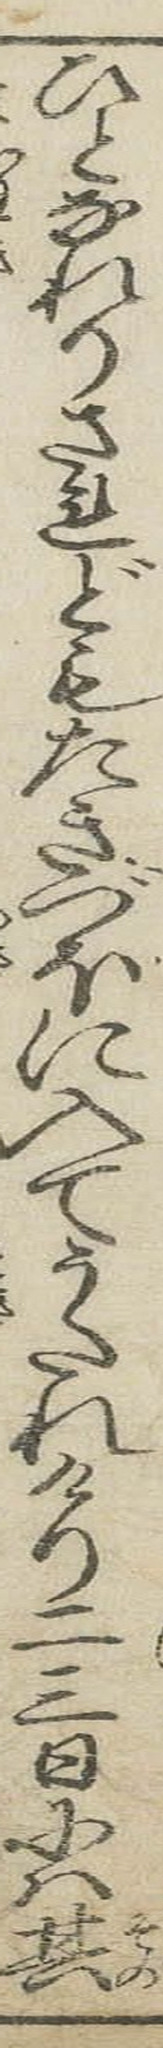ひとなれりされどもたきづほに入てうたれけり二三日には其
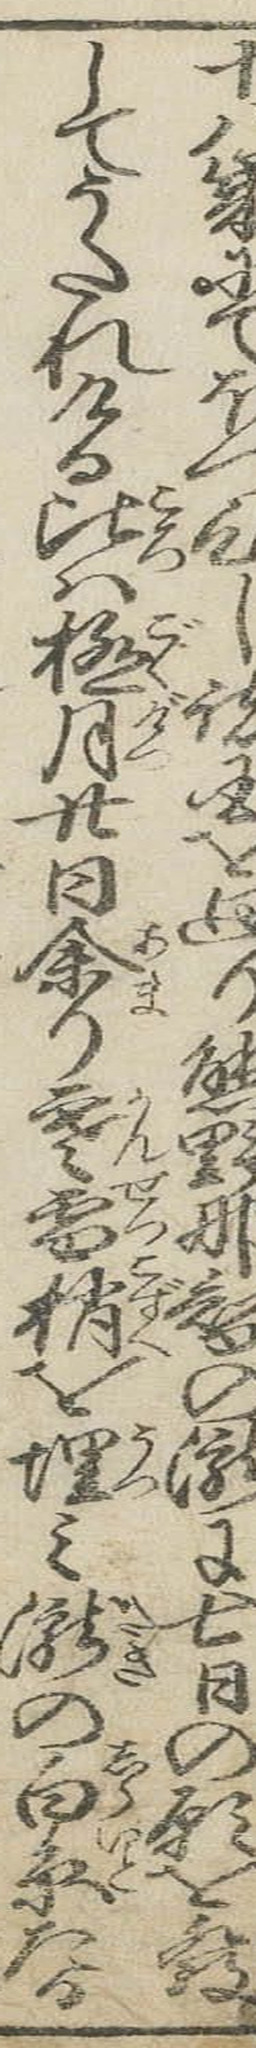してうたれける比は極月廿日余り寒雪梢を埋み滝の白糸たる
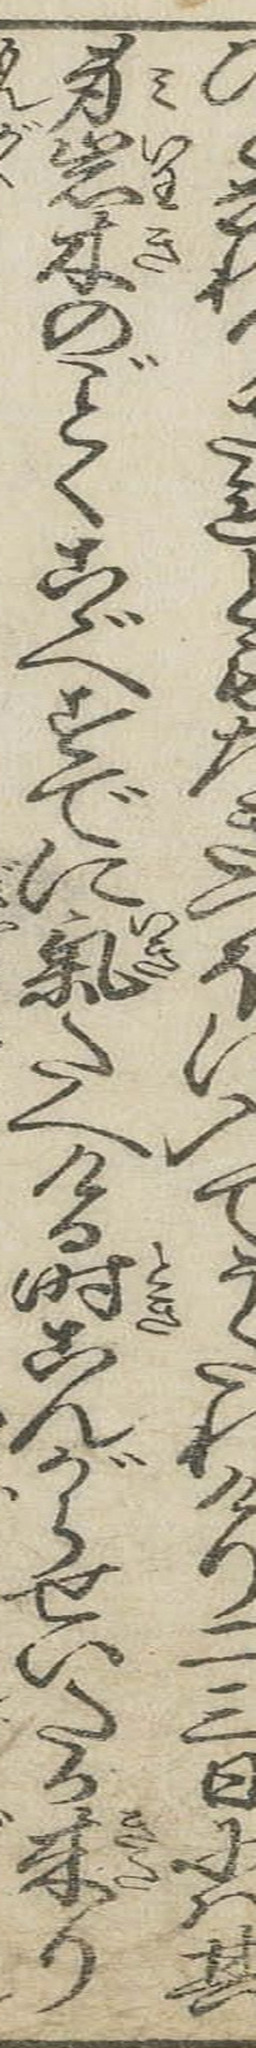身岩木のごとくこゞへすでに気たへける時こんがらせいたか来り
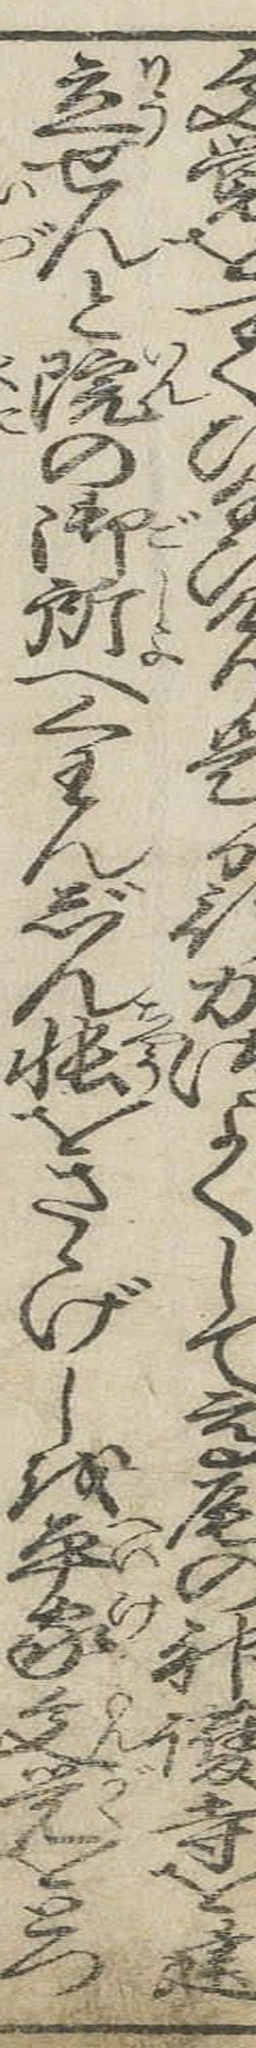立せんと院の御所へくわんじん帳をさゝげしを平家文覚をとつ
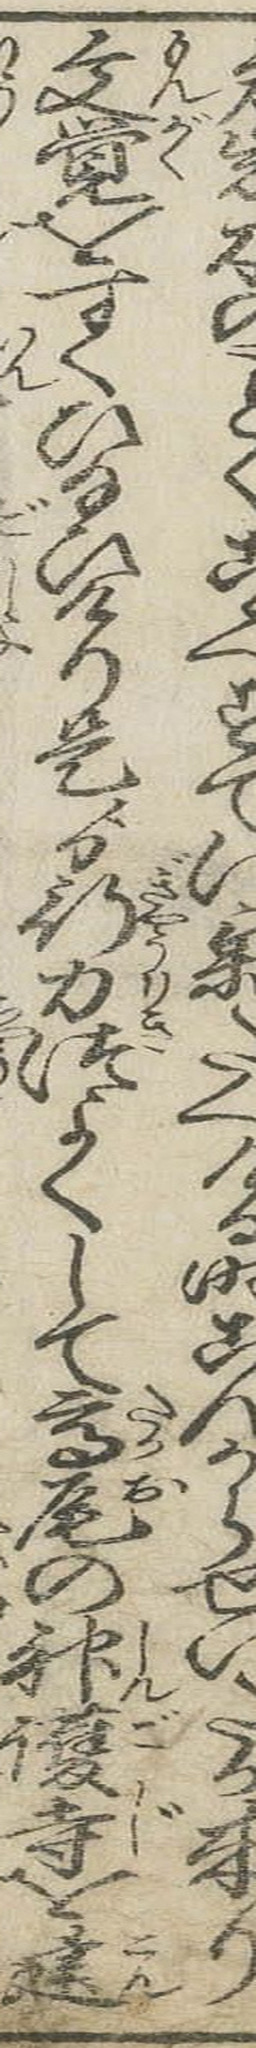文覚をすくひ給ひけり是より行力つよくして高尾の神護寺を建
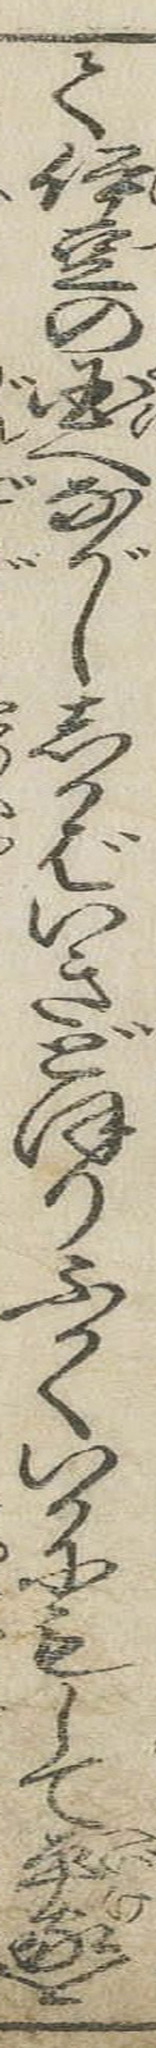て伊豆の国へながししかばいきどほりふかくいかにもして平家を
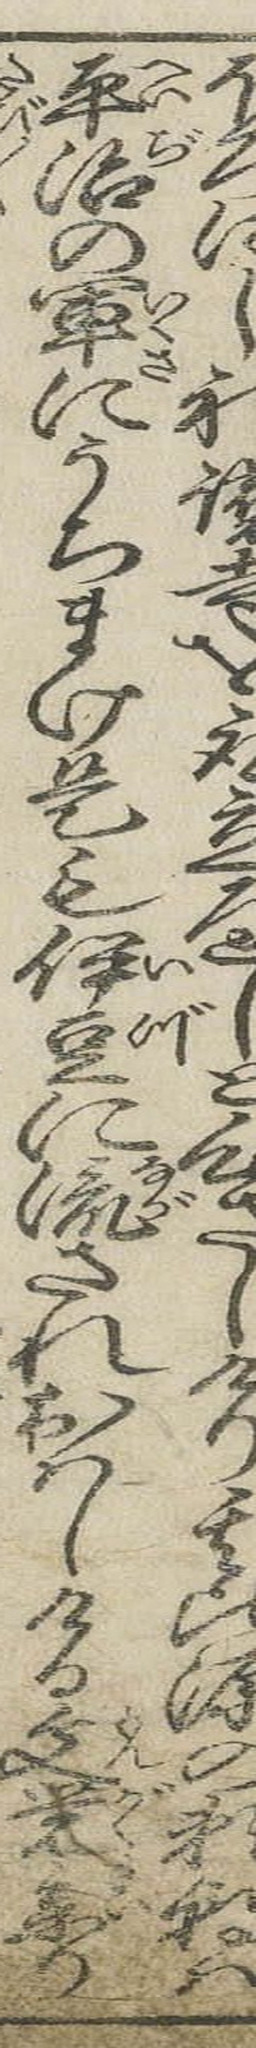平治の軍にうちまけ是も伊豆に流されおはしける文覚参り
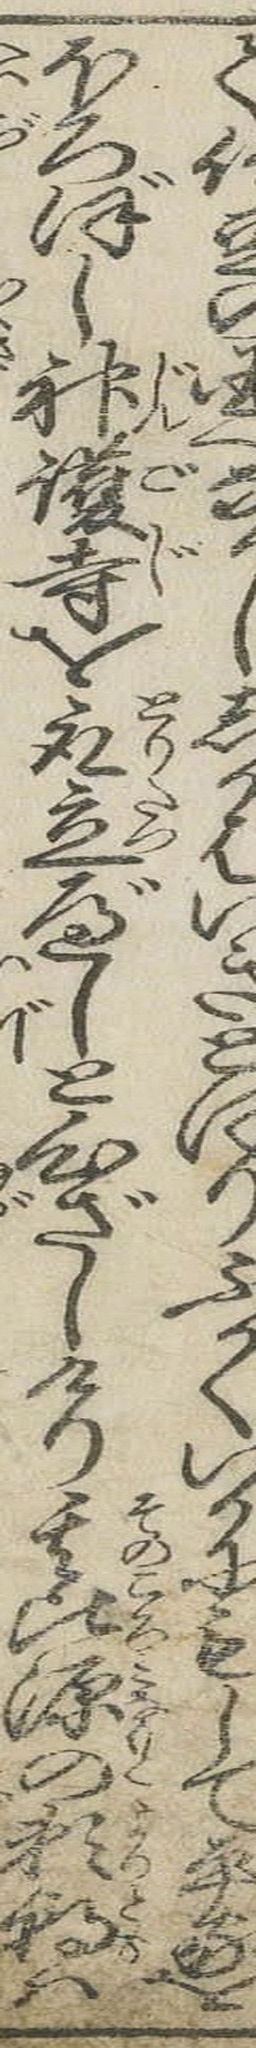ほろぼし神護寺を取立べしと心ざしけり其比源の頼朝は
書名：絵本写宝袋 9巻 3之巻
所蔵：東京学芸大学教育コンテンツアーカイブ
